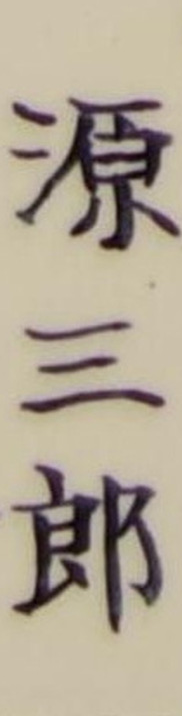源三郎
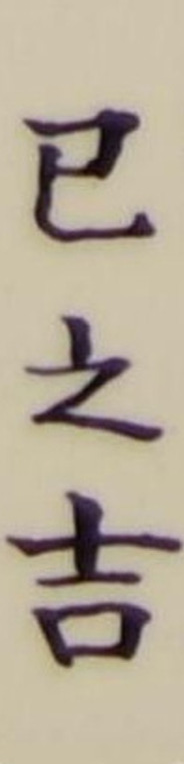巳之吉
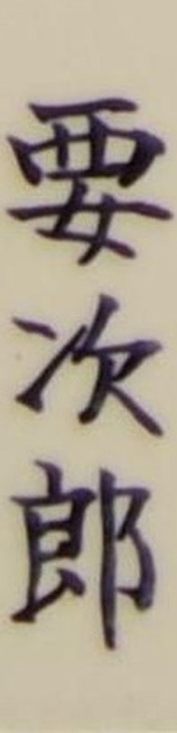要次郎
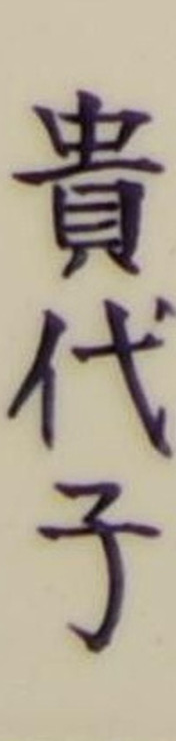貴代子
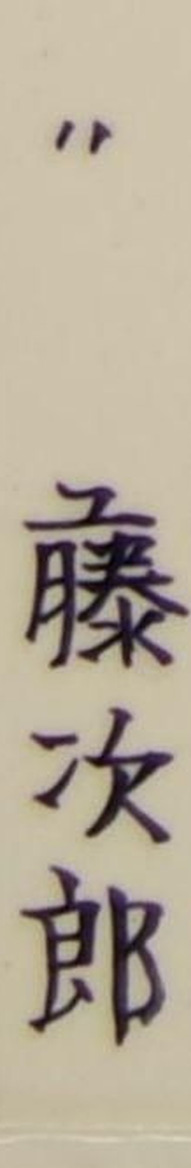藤次郎
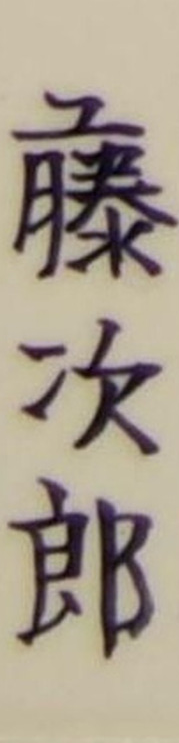藤次郎

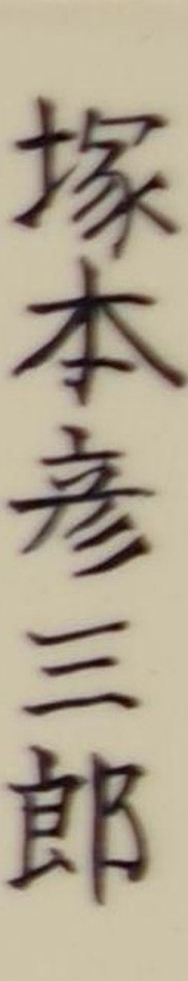塚本彦三郎
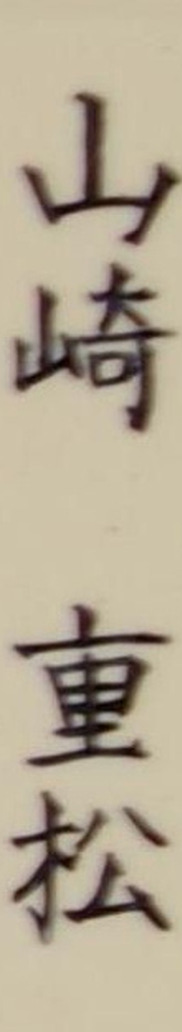山崎重松
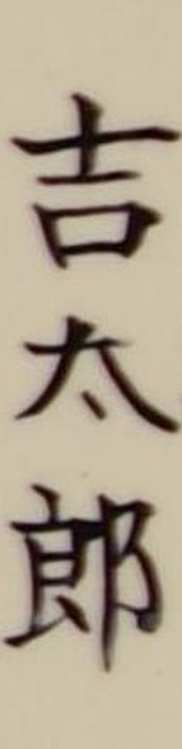吉太郎
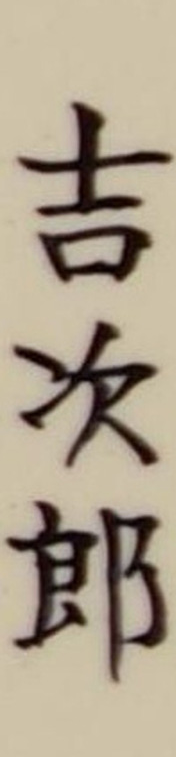吉次郎
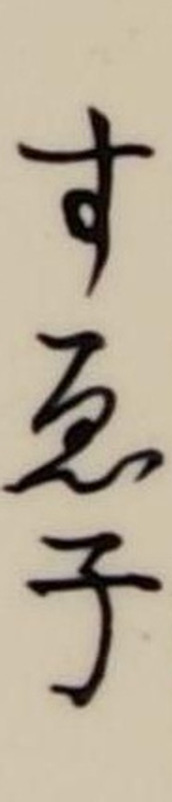すゑ子
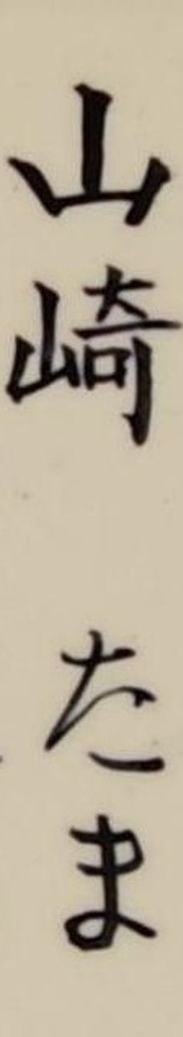山崎たま
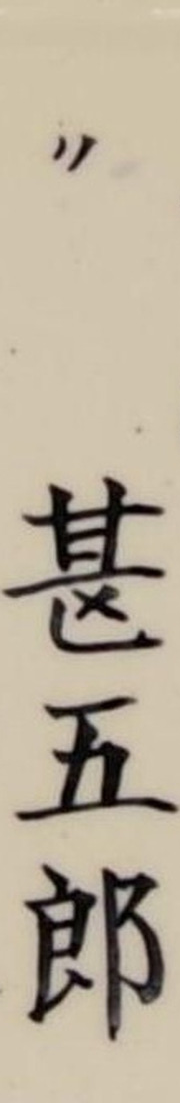甚五郎
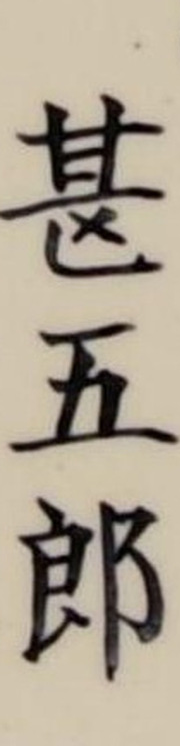甚五郎
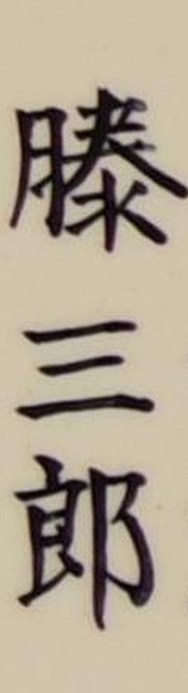勝三郎
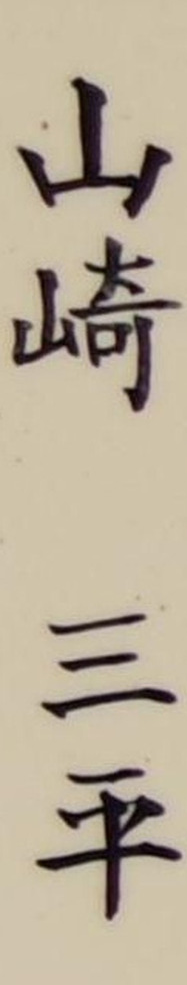山崎三平
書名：A~D
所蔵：koyasan kongobuji
